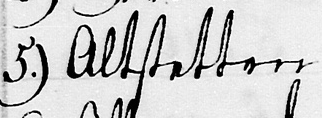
5.) Altstetten
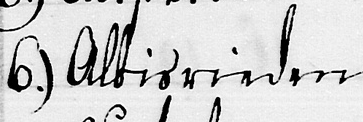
6.) Albisrieden
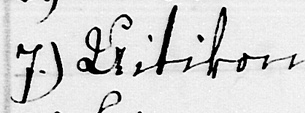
7.) Uitikon
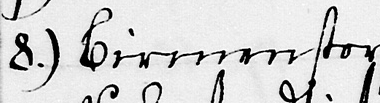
8.) Birmenstorf
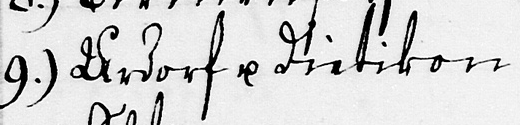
9.) Urdorf u. Dietikon
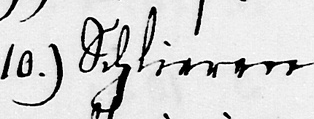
10.) Schlieren
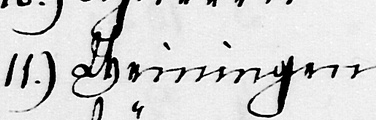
11.) Weiningen
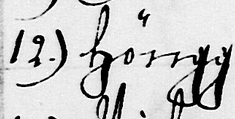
12.) Höngg
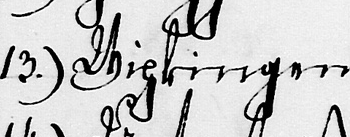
13.) Wipkingen
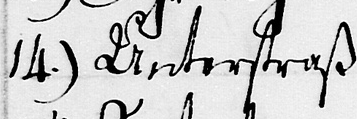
14.) Unterstraß
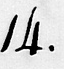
24.
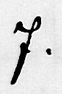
27.
